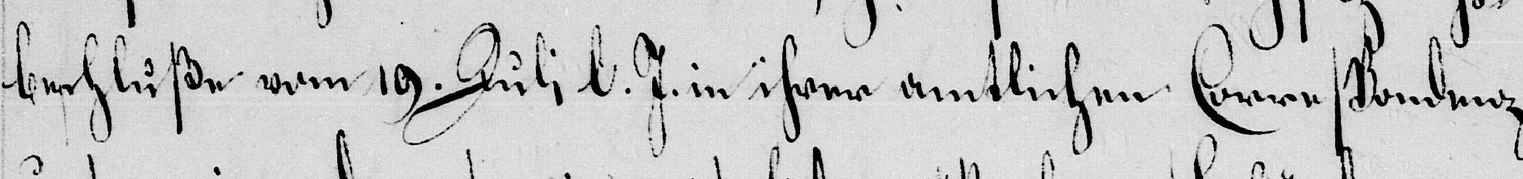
beschluße vom 19. Juli d. J. in ihrer amtlichen Corresepondenz
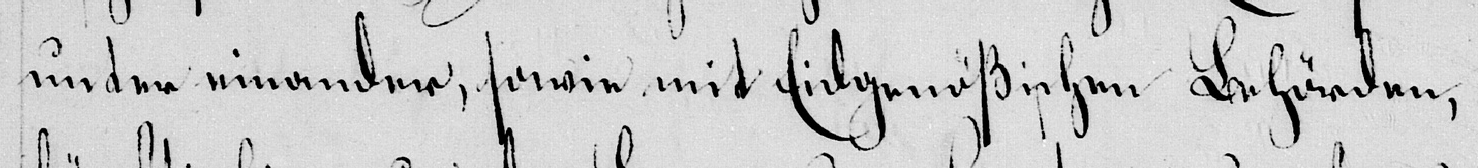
unter einander, sowie mit Eidgenößischen Behörden,
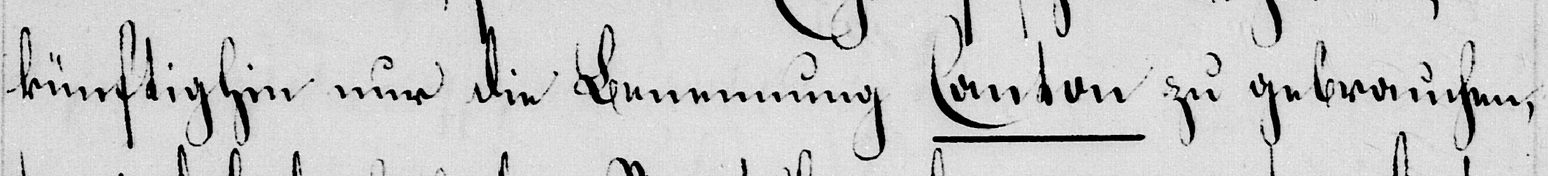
künftighin nur die Benennung Canton zu gebrauchen,
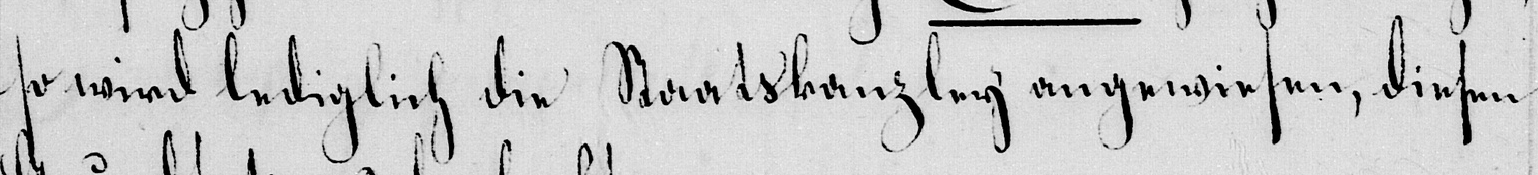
so wird lediglich die Staatskanzley angewiesen, diesen
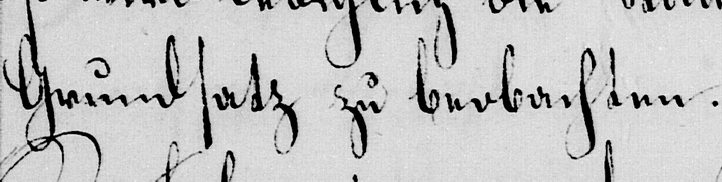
Grundsatz zu beobachten.
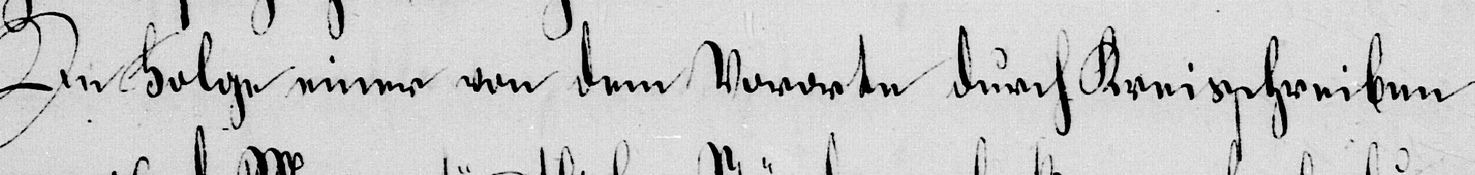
In Folge einer von dem Vororte durch Kreisschreiben
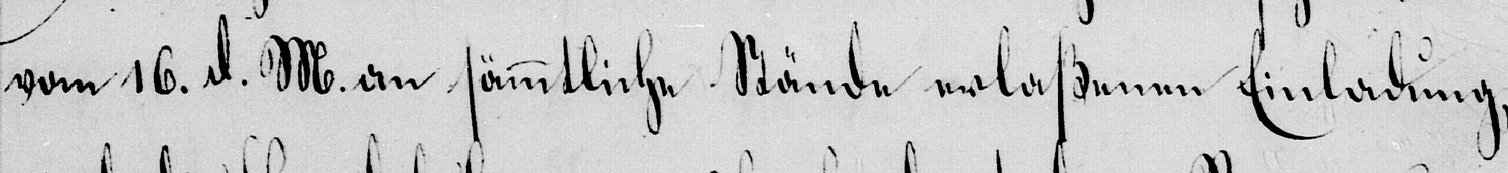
vom 16. d. M. an sämmtliche Stände erlaßene Einladung,
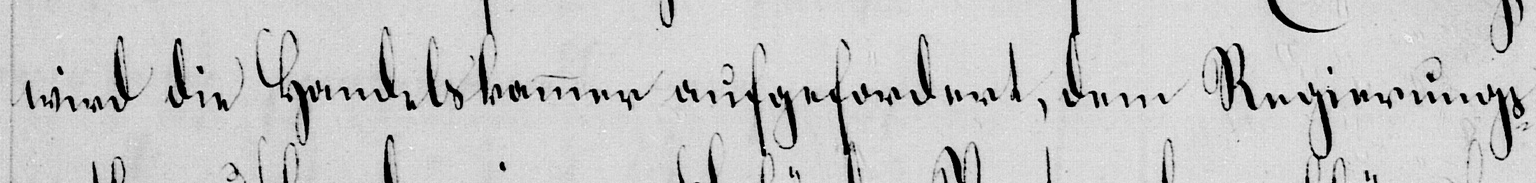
wird die Handelskammer aufgefordert, dem Regierungs¬
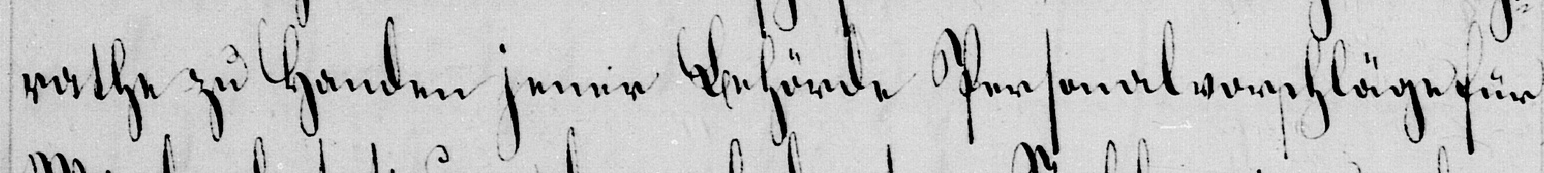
rathe zu Handen jener Behörde Personalvorschläge für
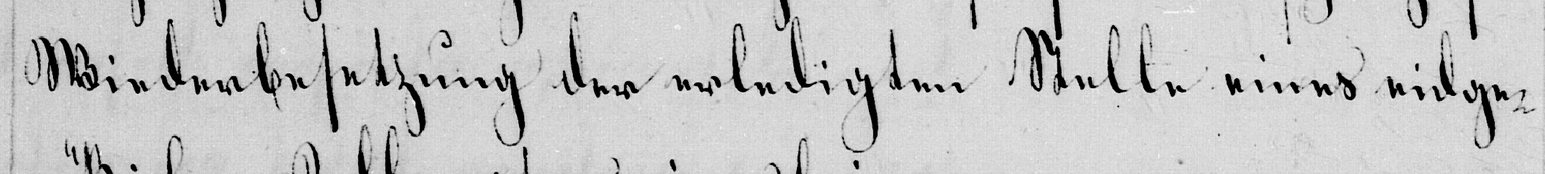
Wiederbesetzung der erledigten Stelle eines Eidge¬
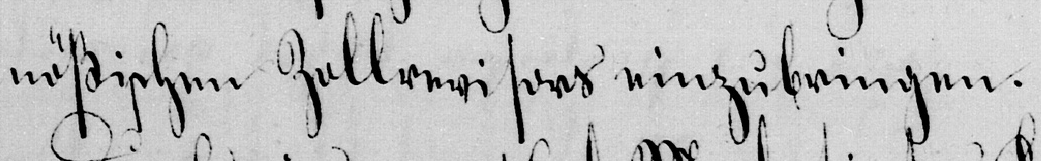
nößischen Zollrevisors einzubringen.
